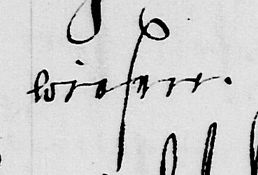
wiesen.
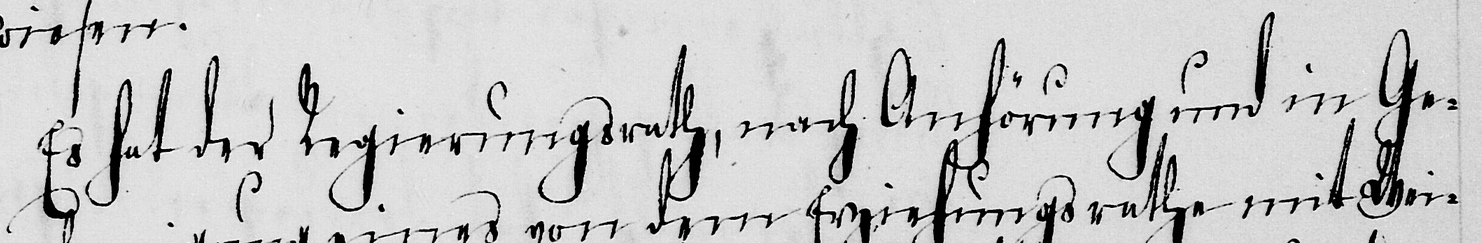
Es hat der Regierungsrath, nach Anhörung und in Ge¬
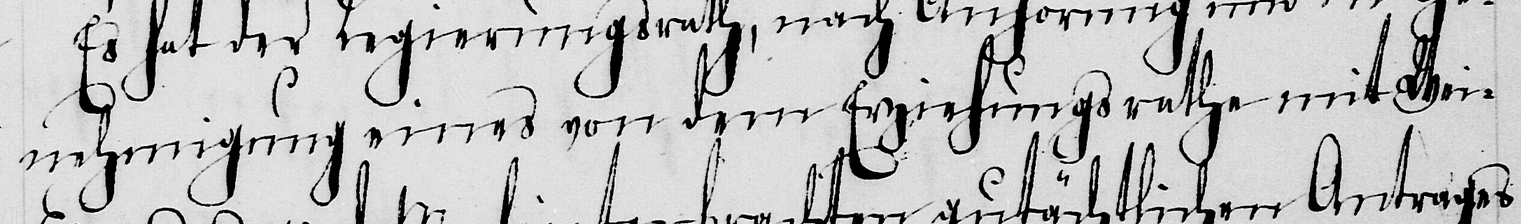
nehmigung eines von dem Erziehungsrathe mit Wei¬
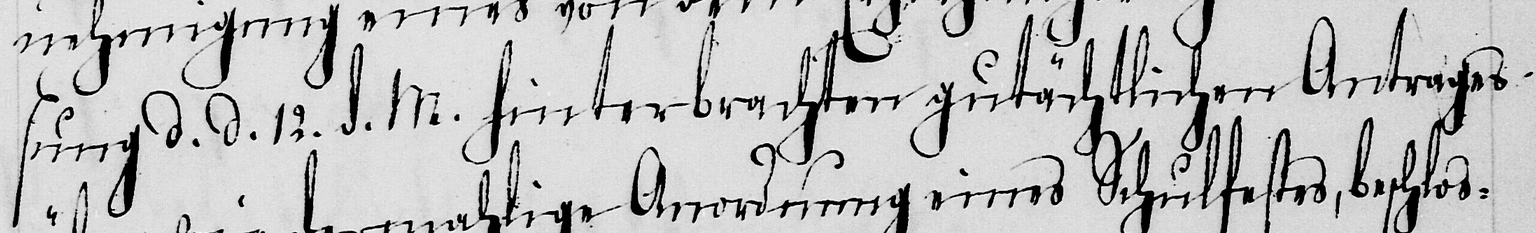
sung d. d. 12. d. M. hinterbrachten gutächtlichen Antrages
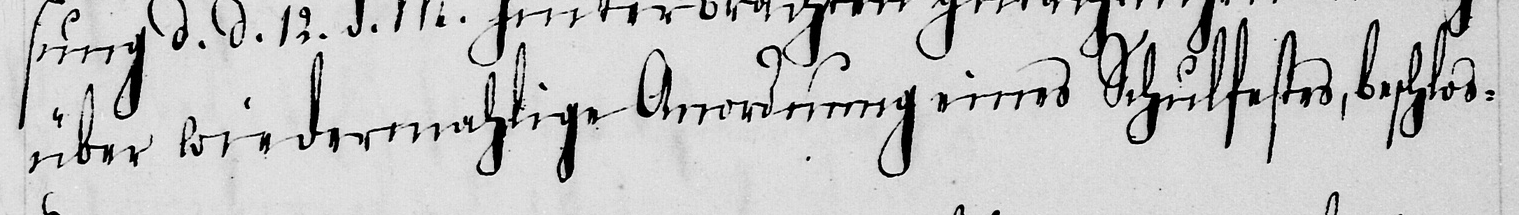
über wiedermahlige Anordnung eines Schulfestes, beschloß¬
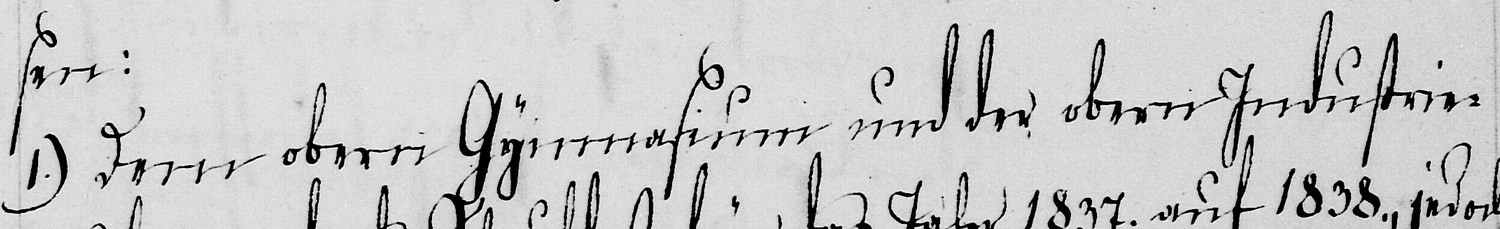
1.) Dem obern Gymnasium und der obern Industrie¬
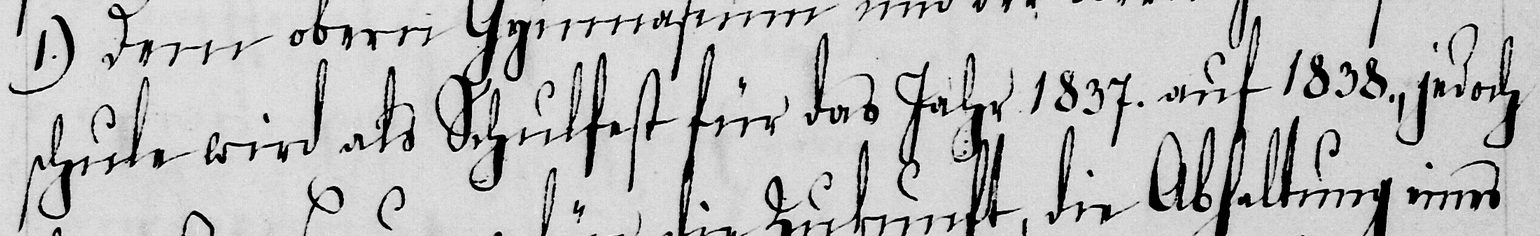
schule wird als Schulfest für das Jahr 1837. auf 1838., jedoch
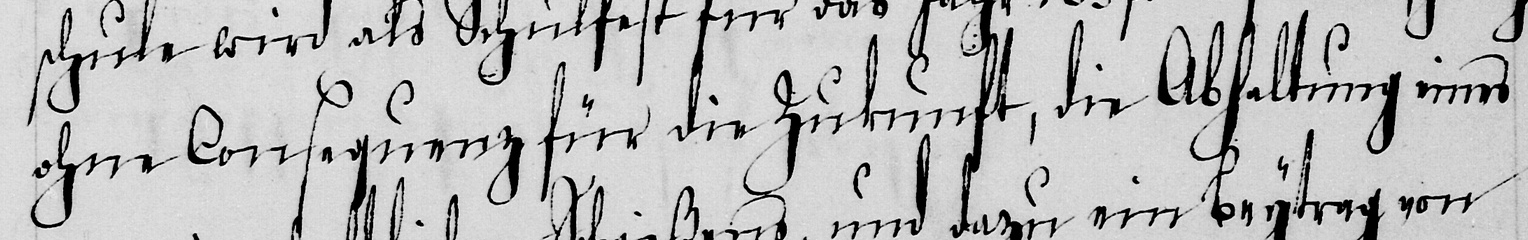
ohne Consequenz für die Zukunft, die Abhaltung eines
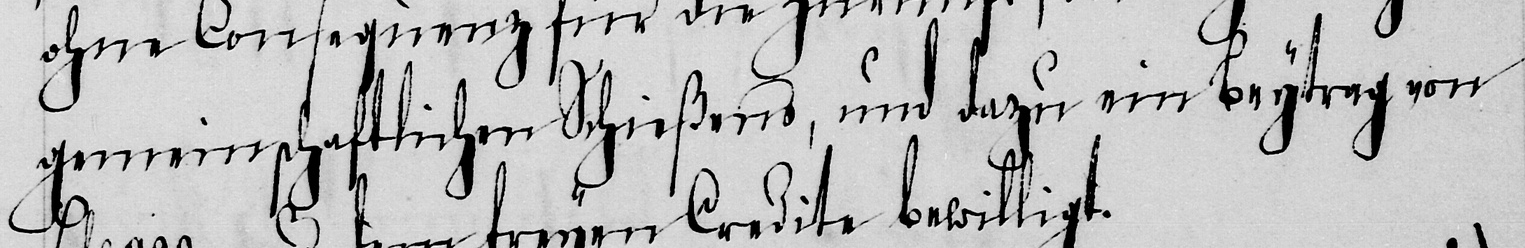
gemeinschaftlichen Schießens, und dazu ein Beytrag von
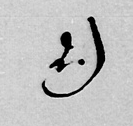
3.)
